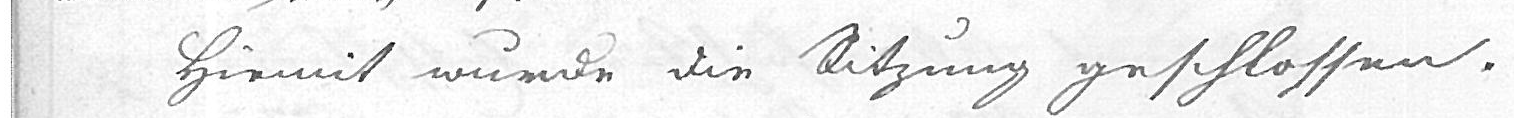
Hiermit wurde die Sitzung geschlossen
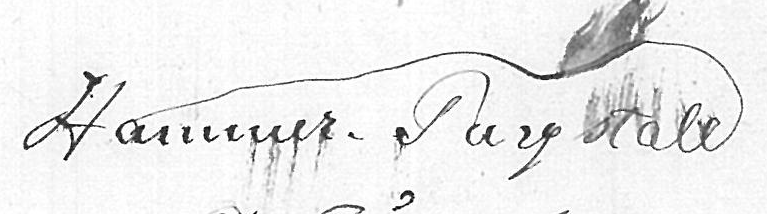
Hammer-Purgstall
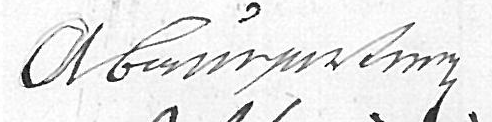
ABaumgartner
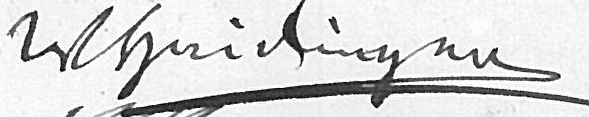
WHaidinger
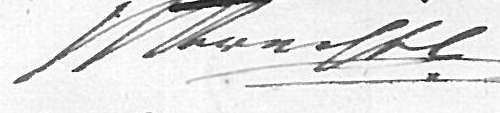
JJPrechtl
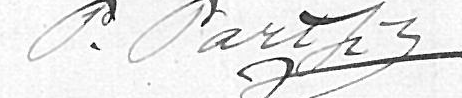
P. Partsch
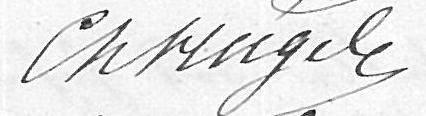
CvHügel
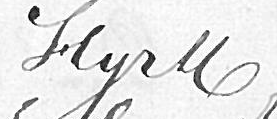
Hyrtl
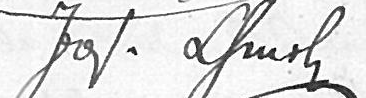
Jos. Chmel
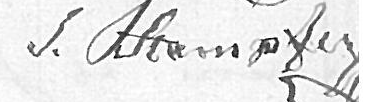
S. Stampfer
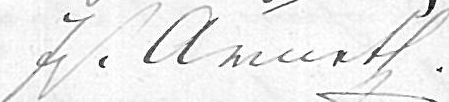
Jv. Arneth
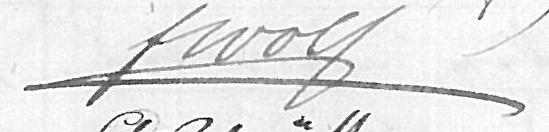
FWolf
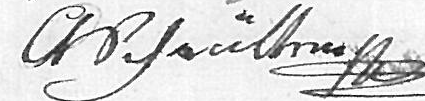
ASchrötter
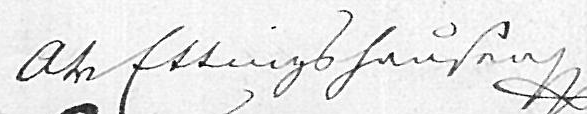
AvEttingshausen
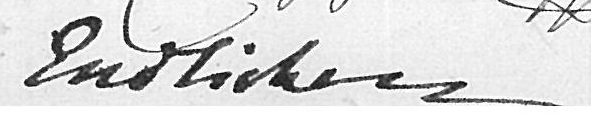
Endlicher
